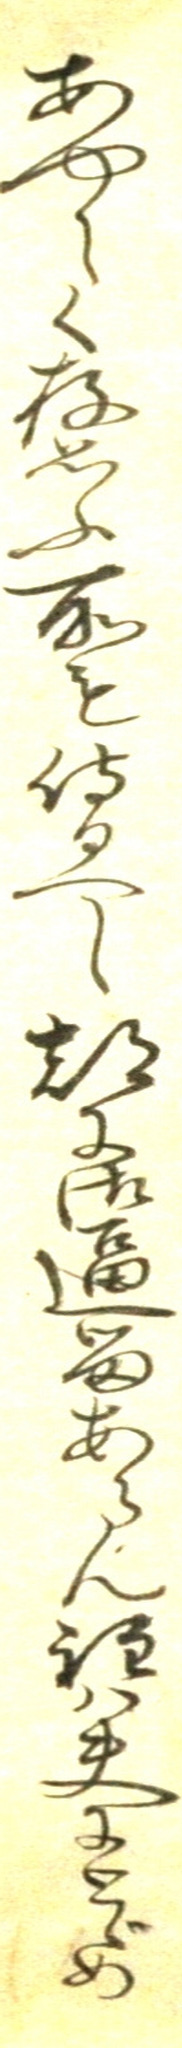あやしく存思ふ所も侍るへし都に御逼留あらん程は夫にとゞめ
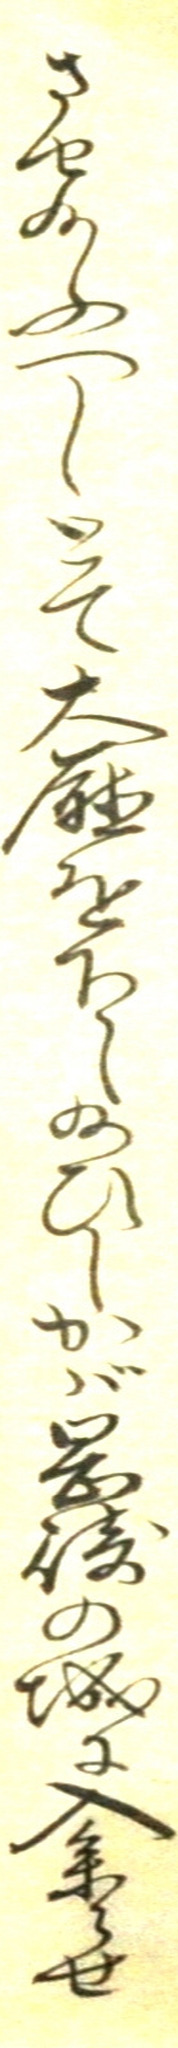させ給ふへしとて大庁を下し給ひしかば岡崎の城に入参らせ

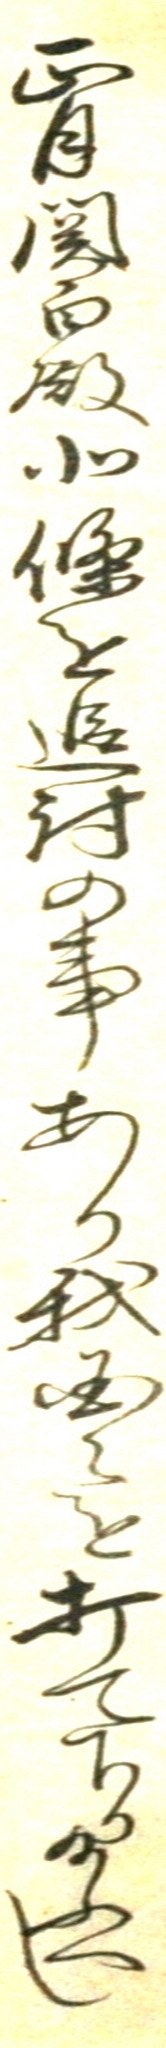正月関白殿北条を追討の事あり我国々を打て下り給ふへし
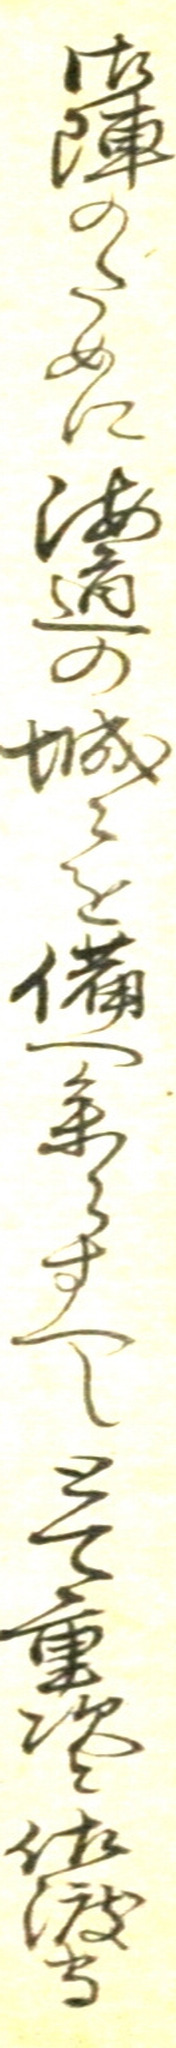御陣のために海道の城々を備へ参らすへしとて重次と佐渡守
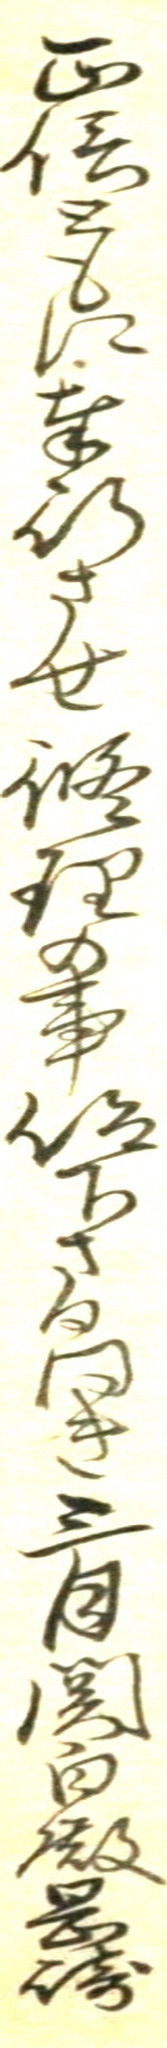正信ともに奉行させ修理の事仰下さる同き三月関白殿岡崎
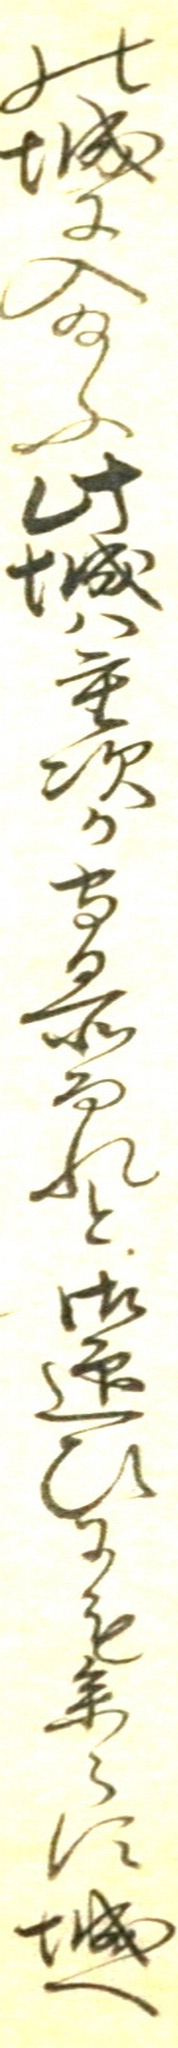の城に入給ふ此城は重次か守る所なれと御迎ひにも参らす城へ
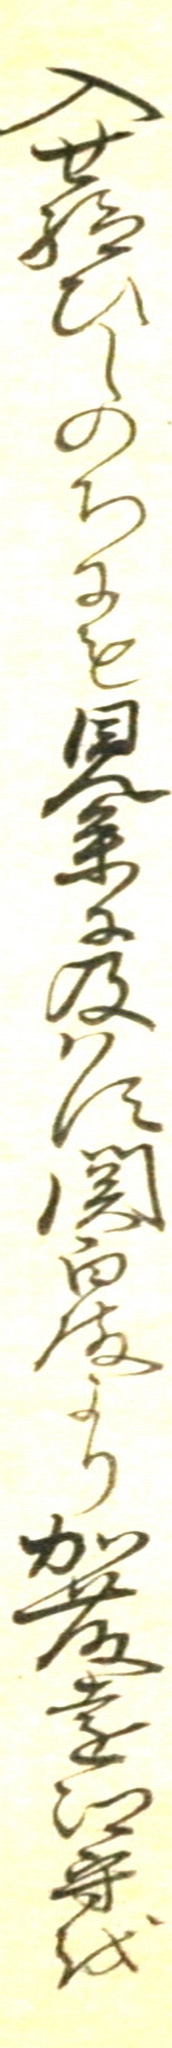入せ給ひしのちにも見参に及はす関白殿より加藤遠江守を
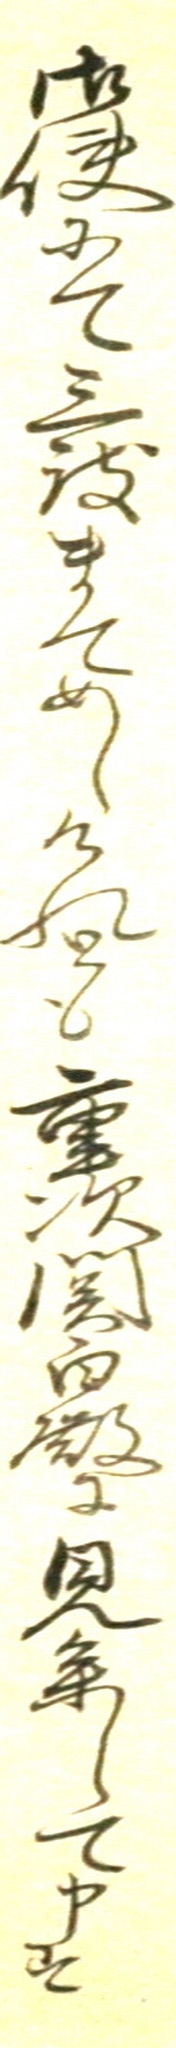御使にて三度まてめしけれとも重次関白殿に見参して申す

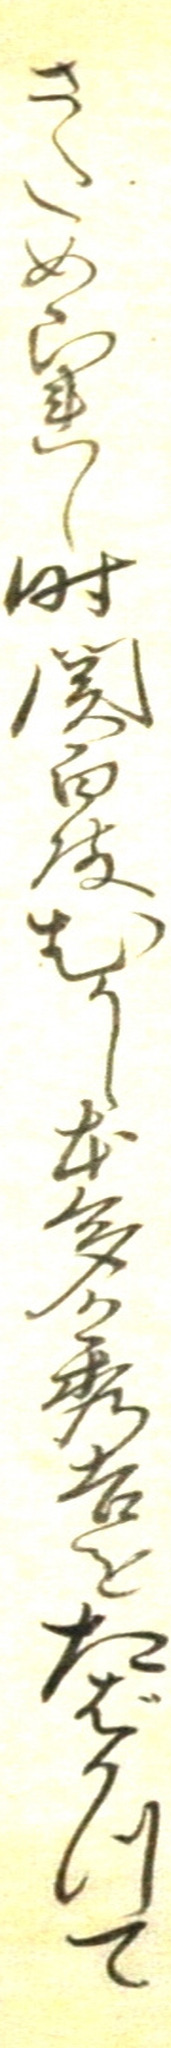さためられし時関白殿むかし本多か秀吉をたばかつて
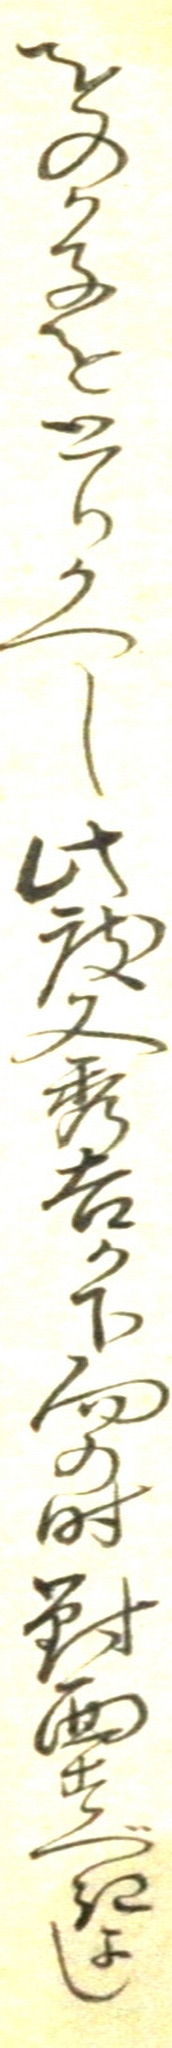をのか子をとりかへし此度又秀吉か下向の時対面すべきよし
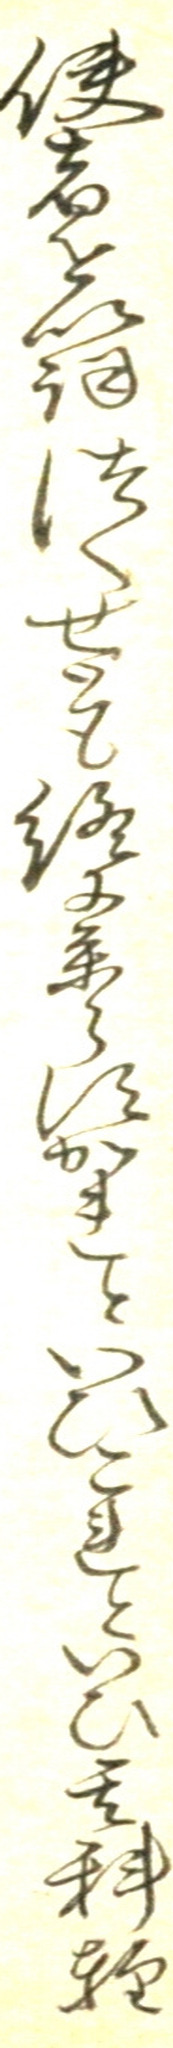使者を以詞つくせとも終に参らすかれといひこれといひ其科軽
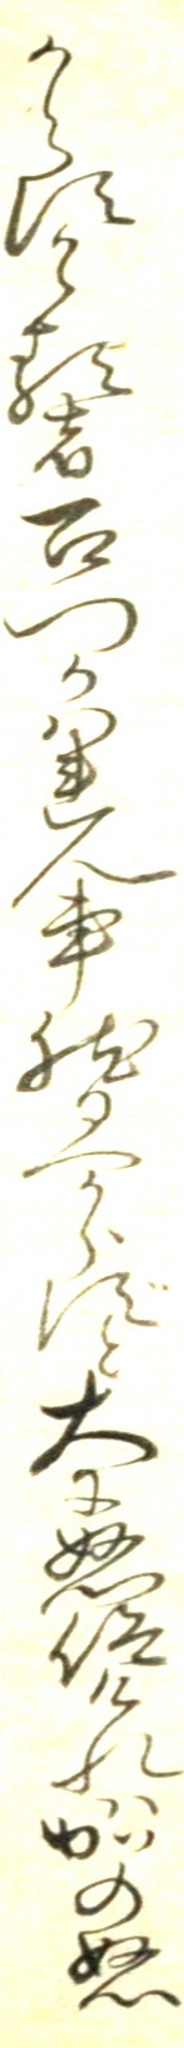からすかゝる者召つかはれん事然るへからずと大に怒仰けれはかの怒
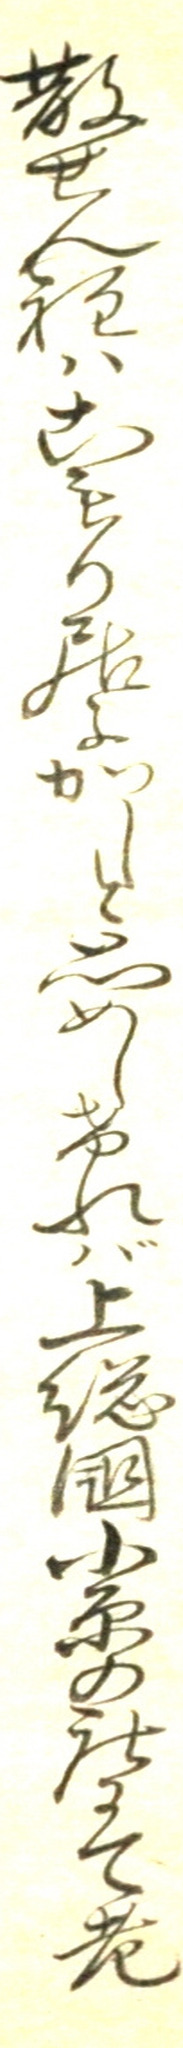散せん程はこもり居よかしと思めしければ上総国小原の庄にて老
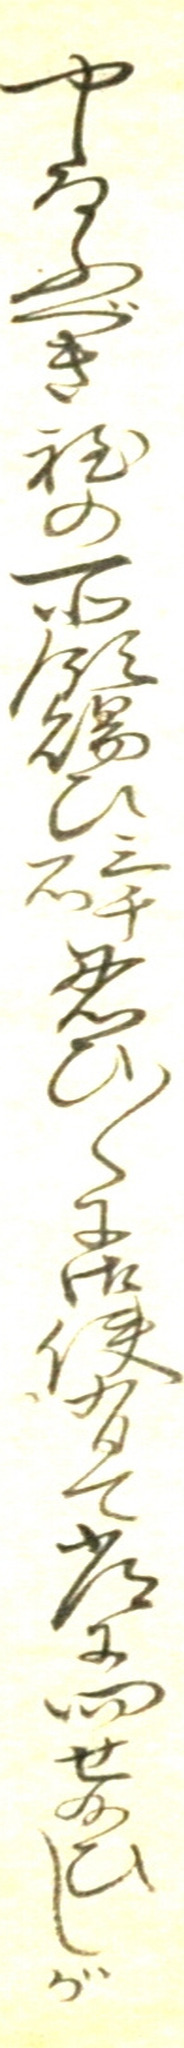やしなふべき程の所領賜三千石忍ひ〳〵に御使有て常に向せ給ひしが

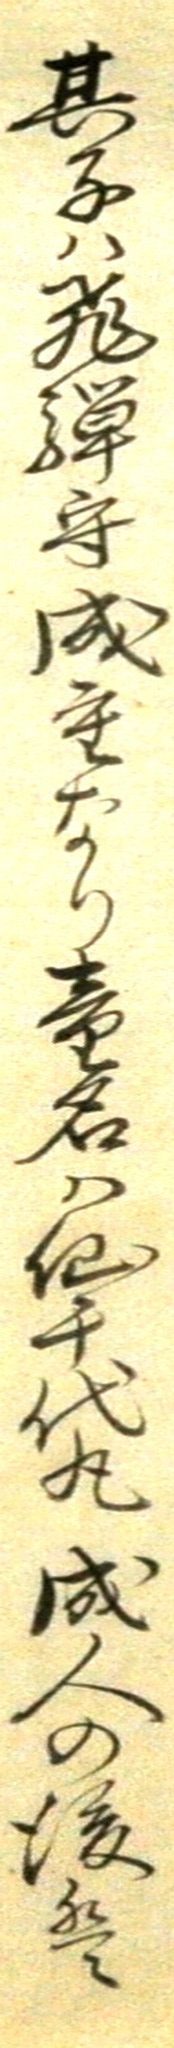其子は飛騨守成重なり童名は仙千代丸成人の後は
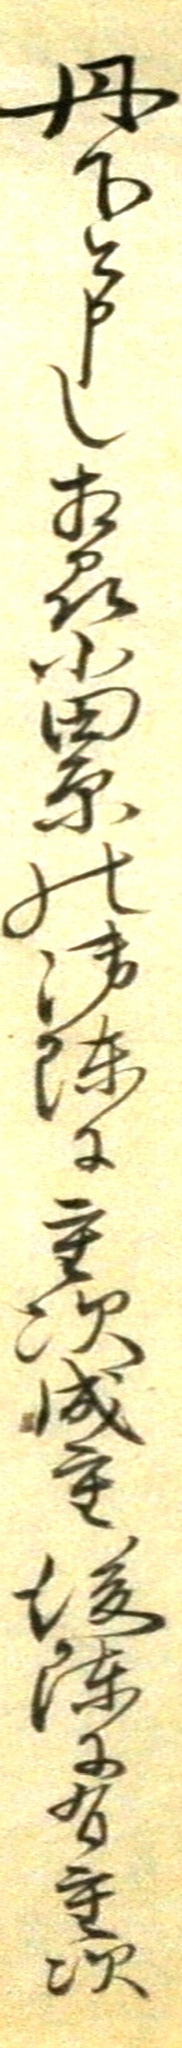丹下と申し相州小田原の御陣に重次成重後陣に有重次
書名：藩翰譜（四・上）
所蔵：伊那市立高遠町図書館・合同会社AMANE
